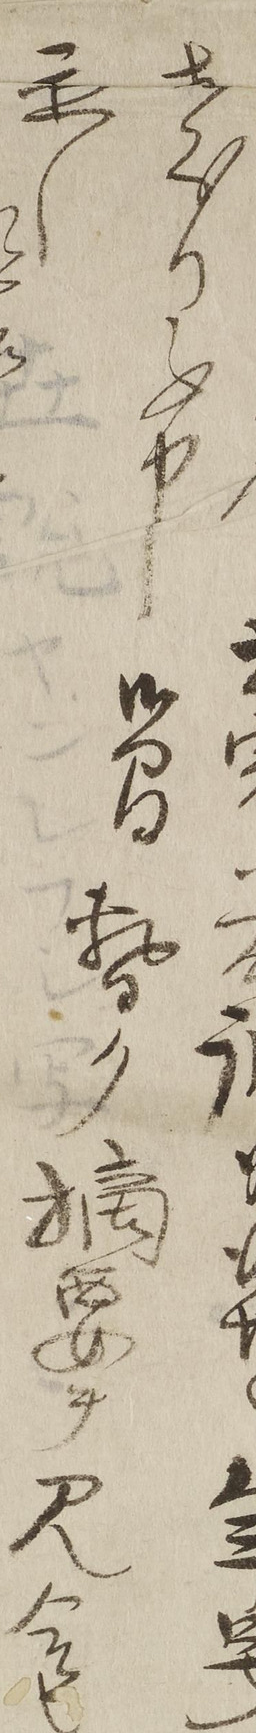相分り不申候間暫ク摘要ヲ見合セ
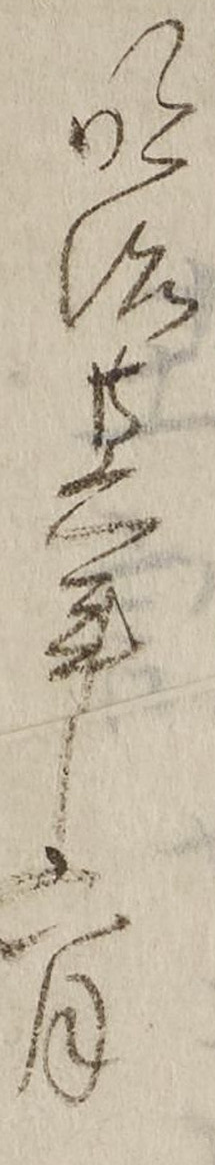明治廿六年六月

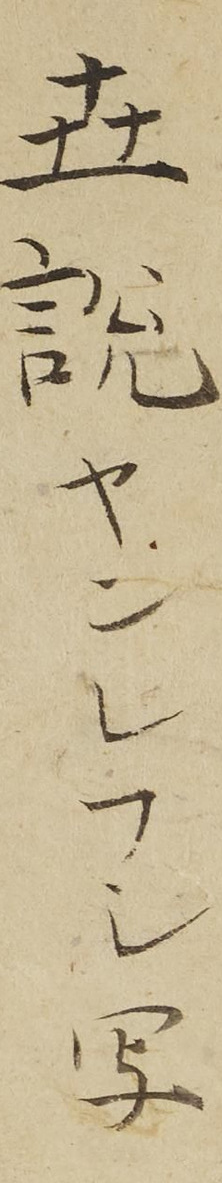世説ヤンレフシ写
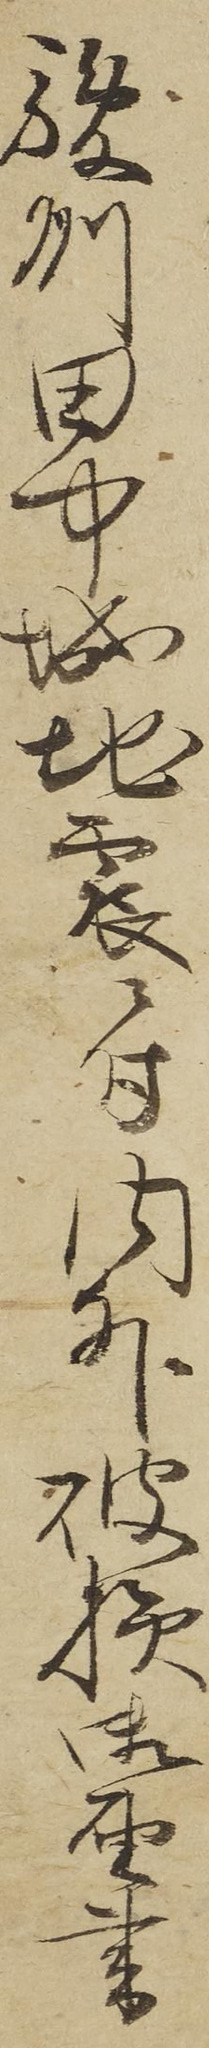駿州田中城地震ニ付内外破損御届書
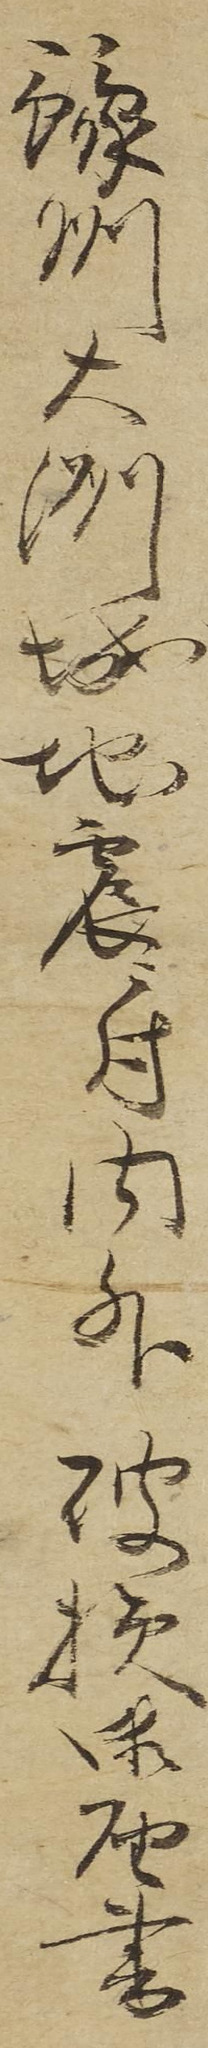豫洲大洲城地震ニ付内外破損御届書
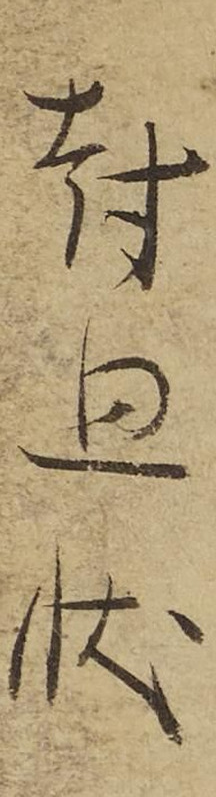封廻状

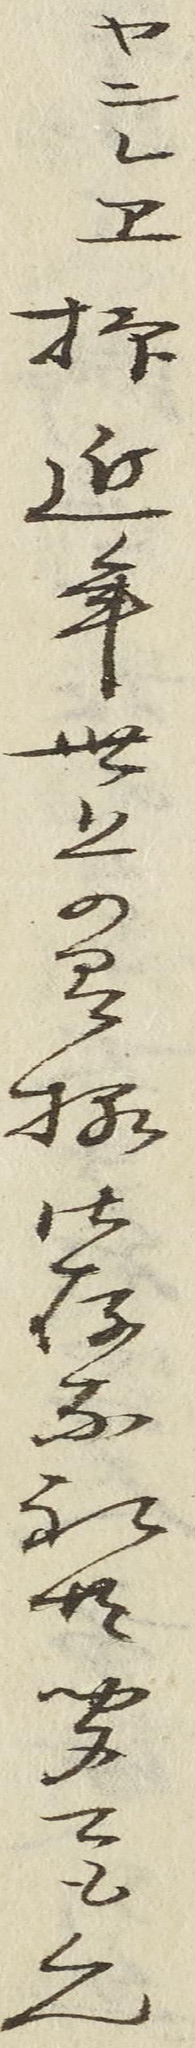ヤンレエ抑近年世上の有様御存知私共聞てもくん
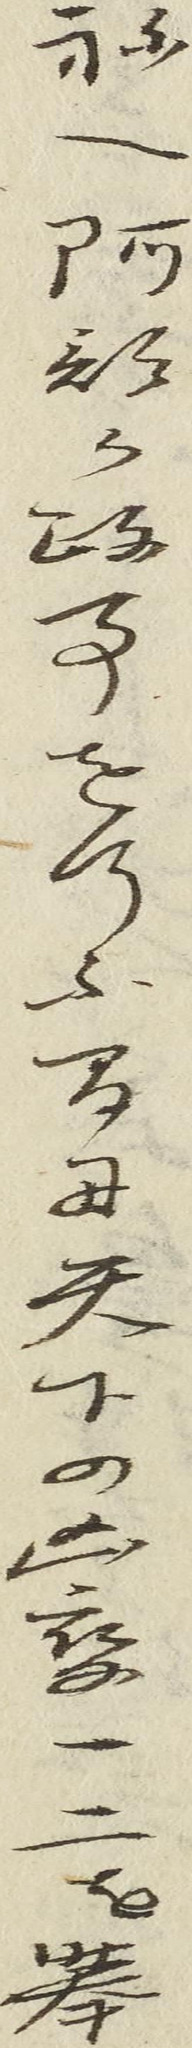ねへ阿部か政事を行ふ間に天下の凶変一二を挙
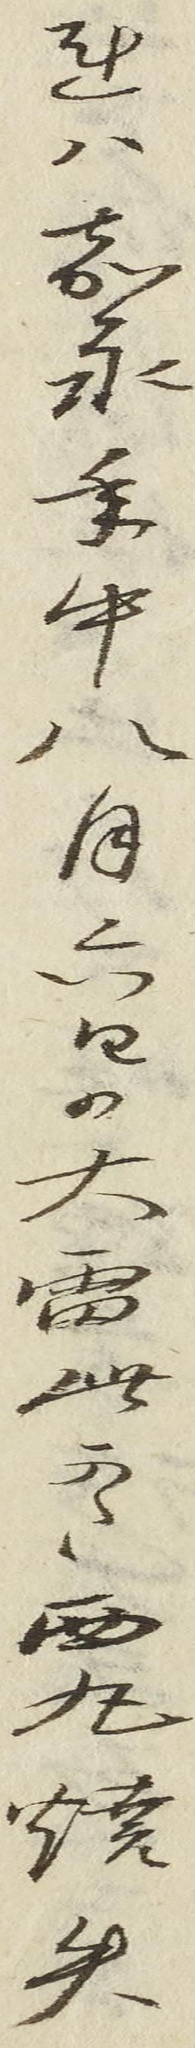れハ嘉永年中八月六日の大雷此かた西丸焼失
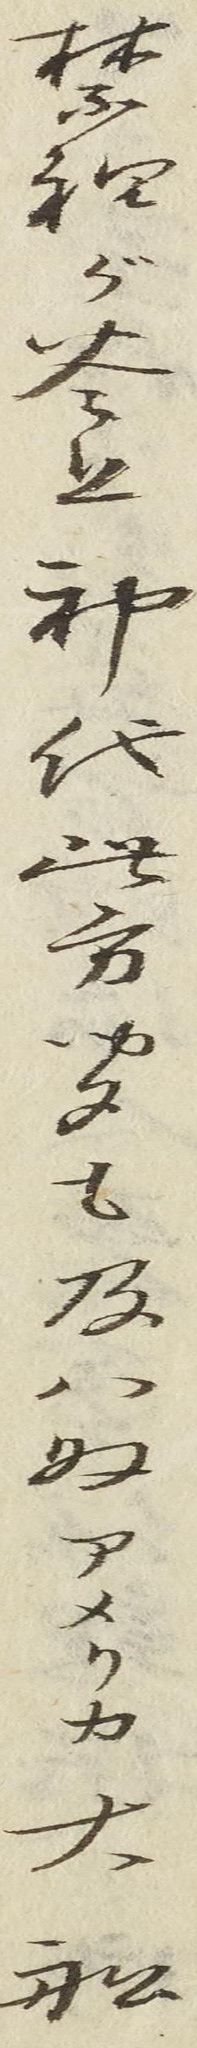禁裏が炎上神代此方聞も及ハぬアメリカ大船
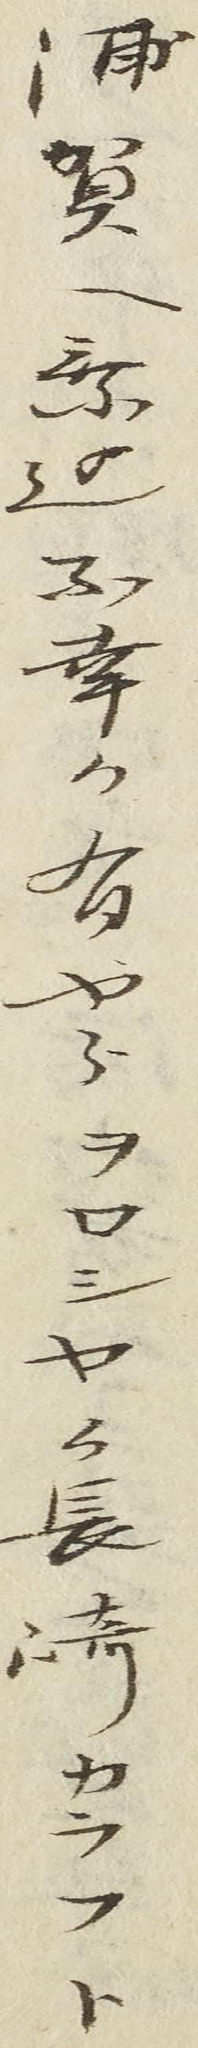浦賀へ乗込不幸か有やらヲロシヤか長崎カラフト
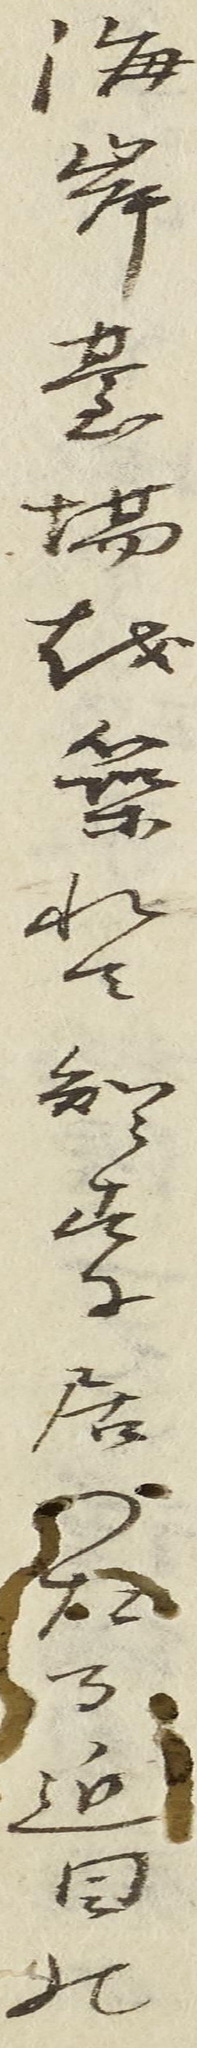海岸台場を築れて知らすに居ッたる近目の
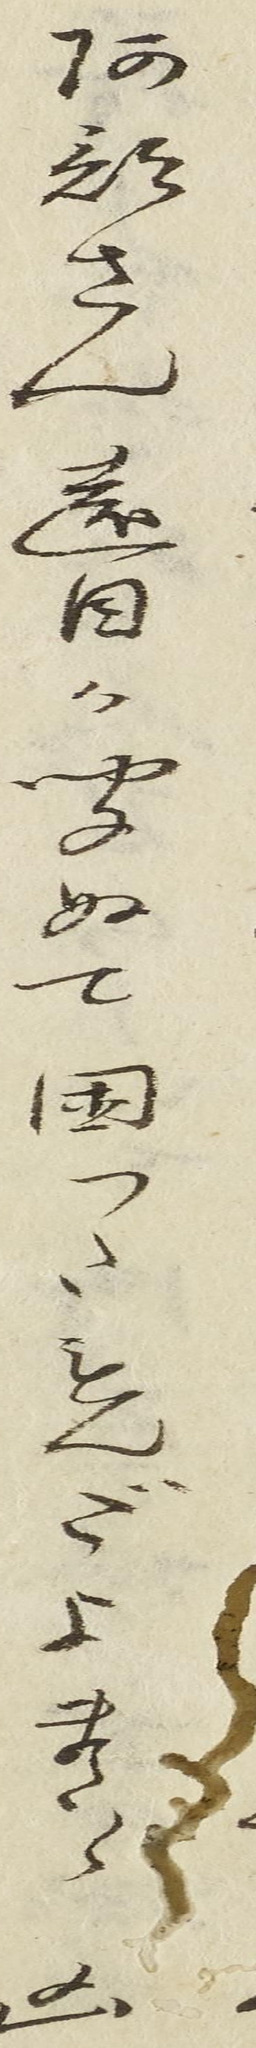阿部さん遠目か聞ぬて困つたもんだよまた〳〵凶
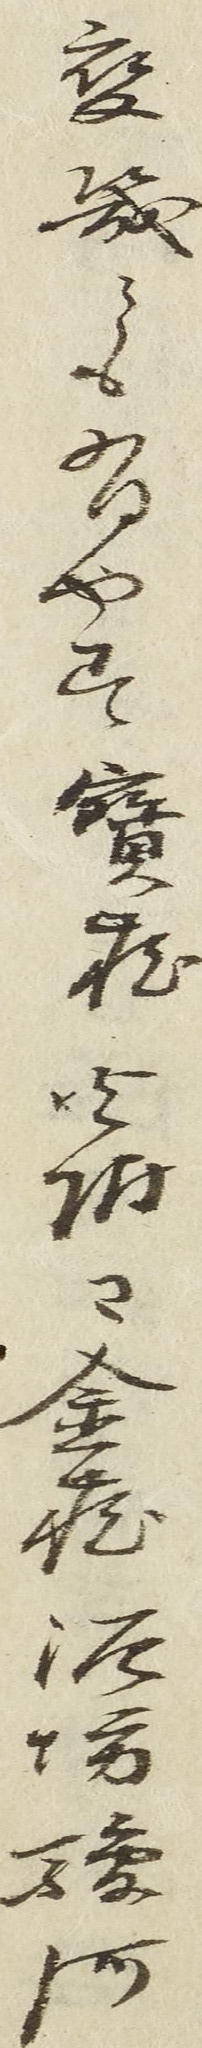変幾らも有やす宝蔵火附に金蔵泥坊駿河
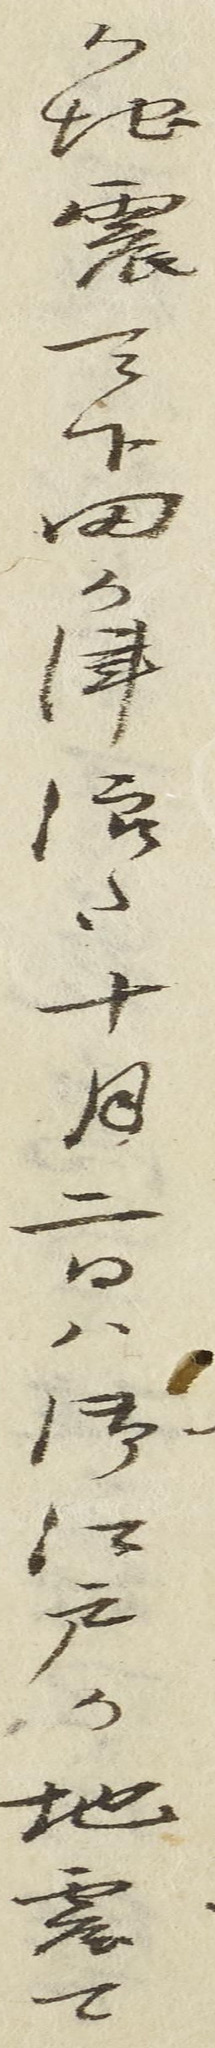か地震天下たか津浪た十月二日ハ御江戸の地震て
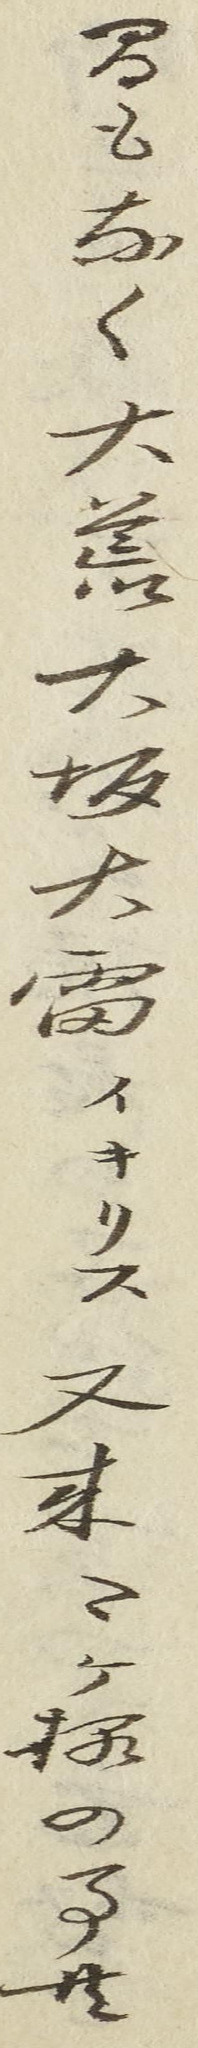間もなく大荒大坂大雷イキリス又来たケ様の事共
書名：世説ヤンレフシ写、駿州田中城地震ニ付内外破損御届書、豫州大洲城地震ニ付内外破損御届書・封廻状
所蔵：東京大学地震研究所図書室 Earthquake Research Institute Library, The University of Tokyo, JAPAN
